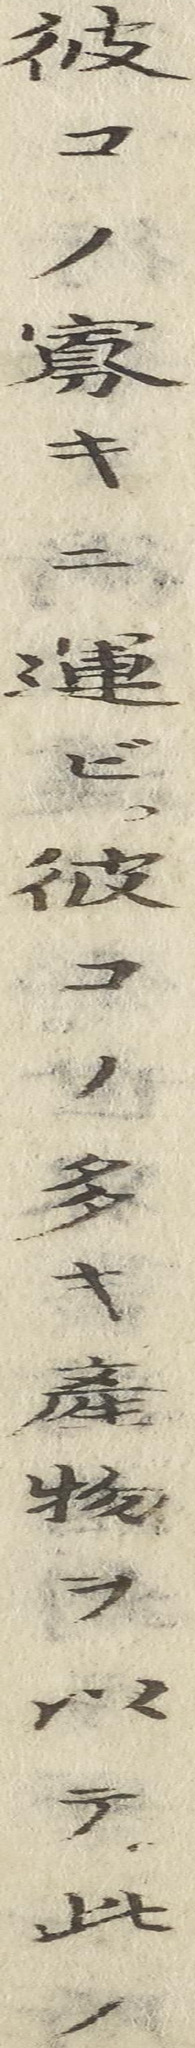彼コノ寡キニ運ビ。彼コノ多キ産物ヲ以テ此ノ
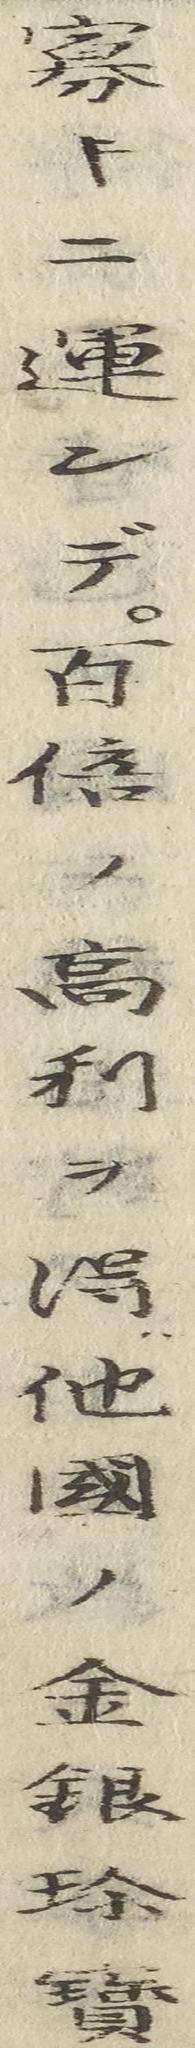寡キニ運ンデ。百倍ノ高利ヲ得他国ノ金銀珍宝

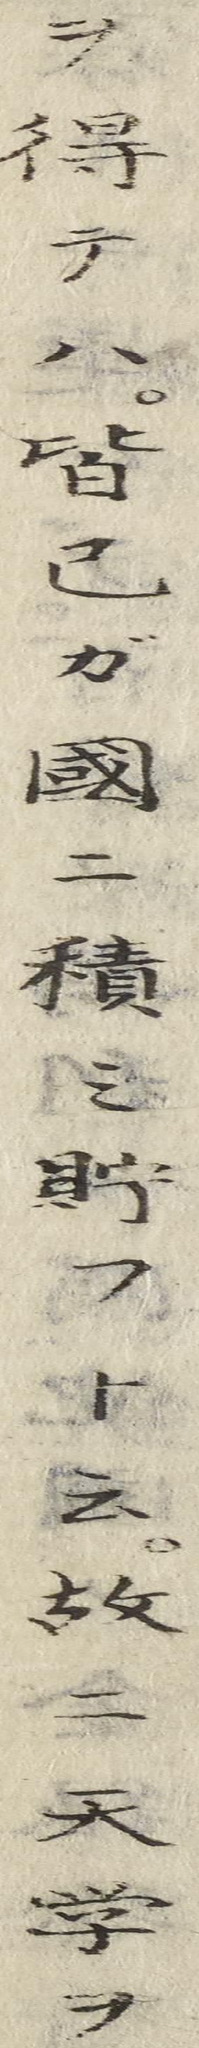ヲ得テハ。皆己ガ国ニ積ミ貯フト云。故ニ天学ヲ
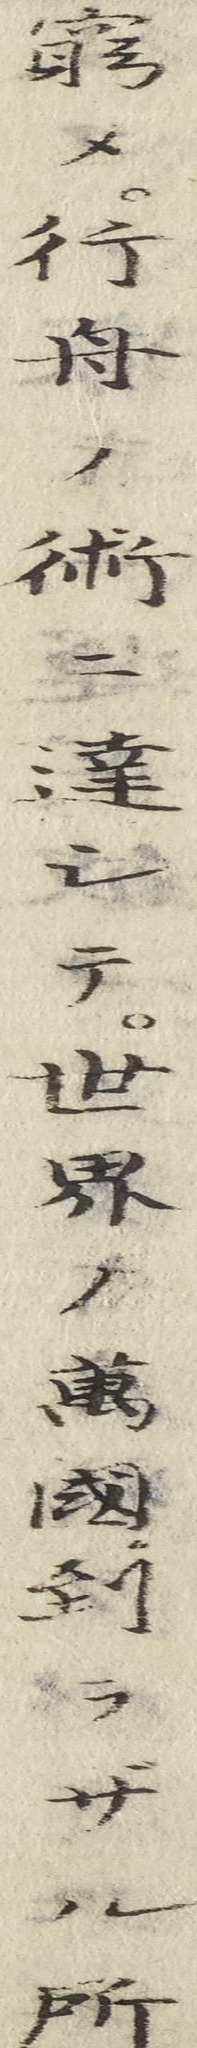窮メ。行舟ノ術ニ達シテ。世界ノ万国到ラザル所
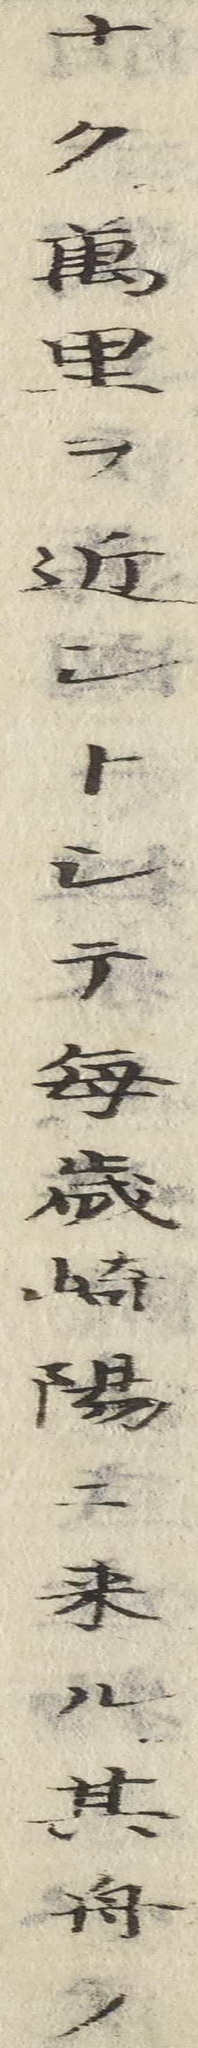ナク万里ヲ近シトシテ毎歳崎陽ニ来ル。其舟ノ
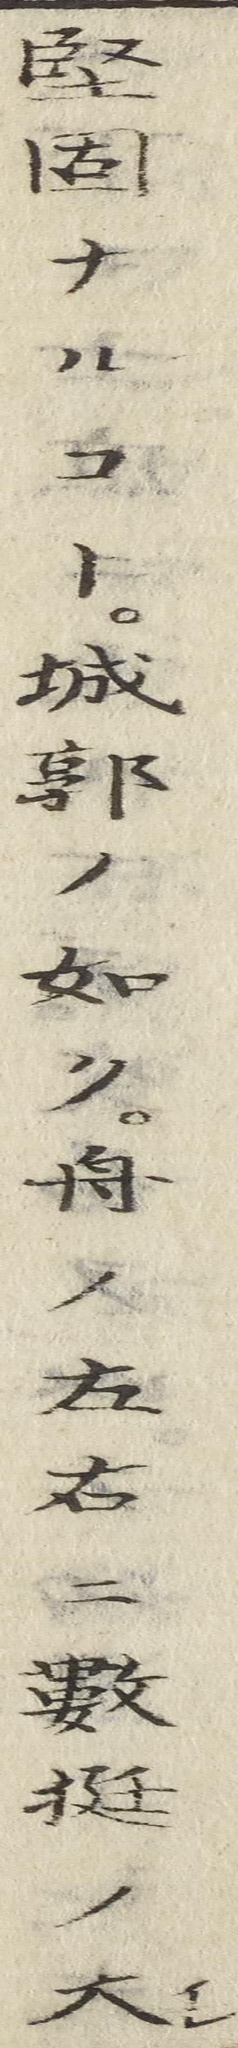堅固ナルコト。城郭ノ如ク。舟ノ左右ニ数挺ノ大
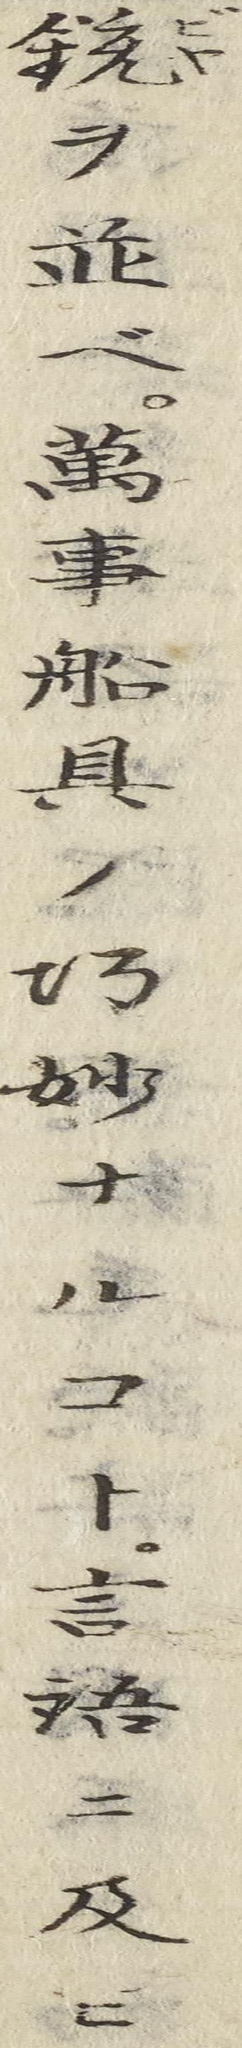銃ヲ並ベ。万事船具ノ巧妙ナルコト。言語ニ及ビ
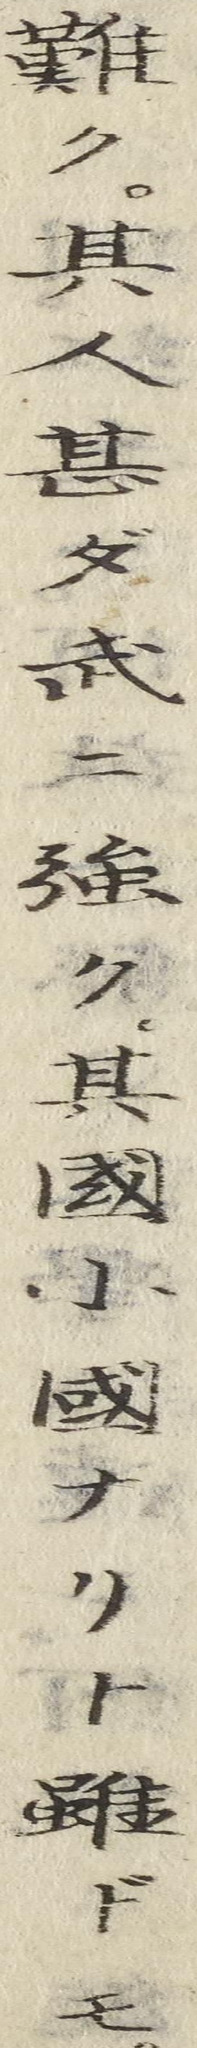難ク。其人甚ダ武ニ強ク。其国小国ナリト雖ドモ。
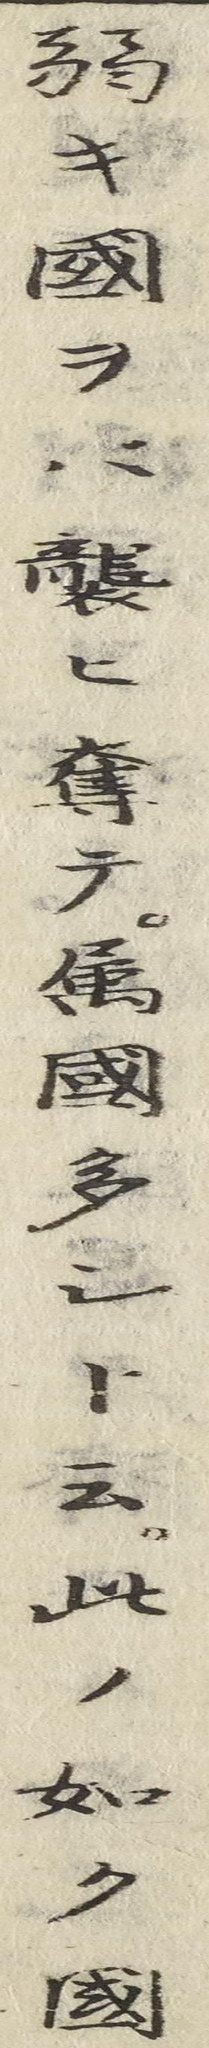弱キ国ヲバ襲ヒ奪テ。属国多シト云。此ノ如ク国
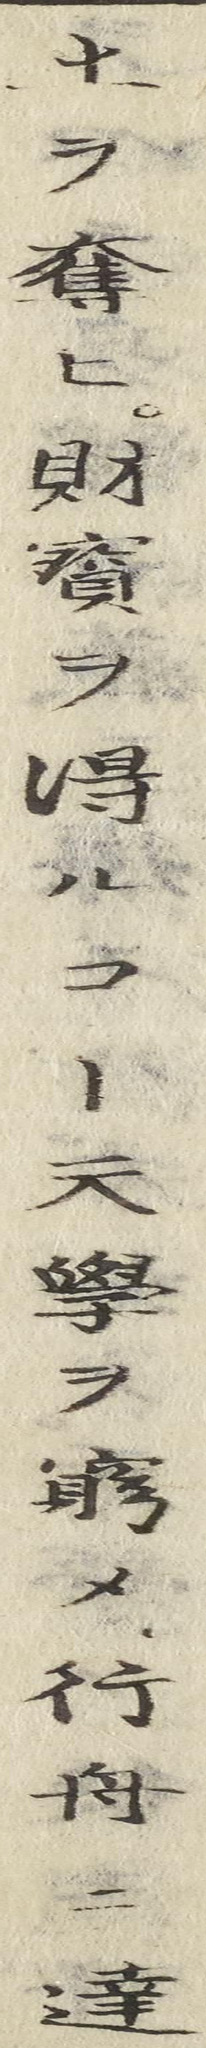土ヲ奪ヒ。財宝ヲ得ルコト天学ヲ窮メ行舟ニ達
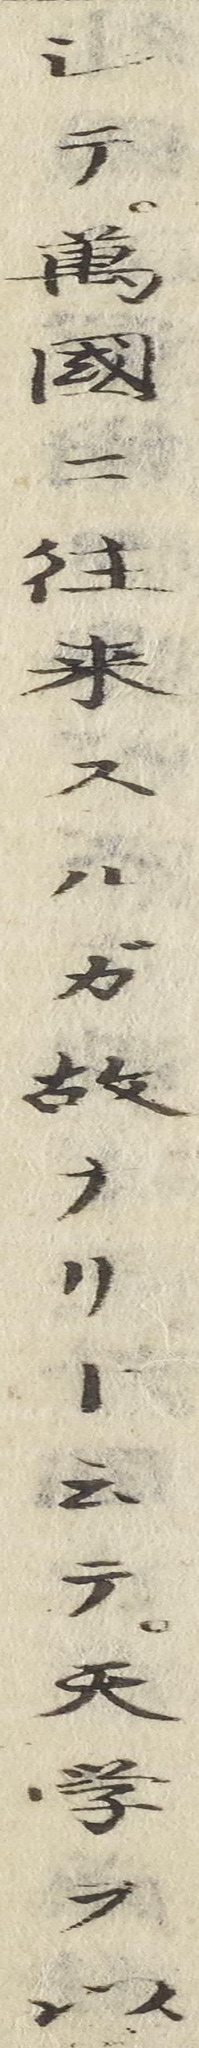シテ。万国ニ往来スルガ故ナリト云テ。天学ヲ以
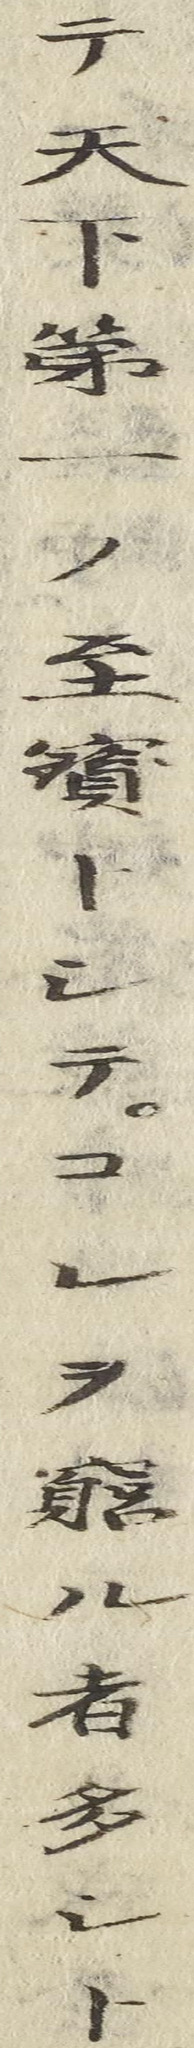テ天下第一ノ至宝トシテ。コレヲ窮ル者多シト
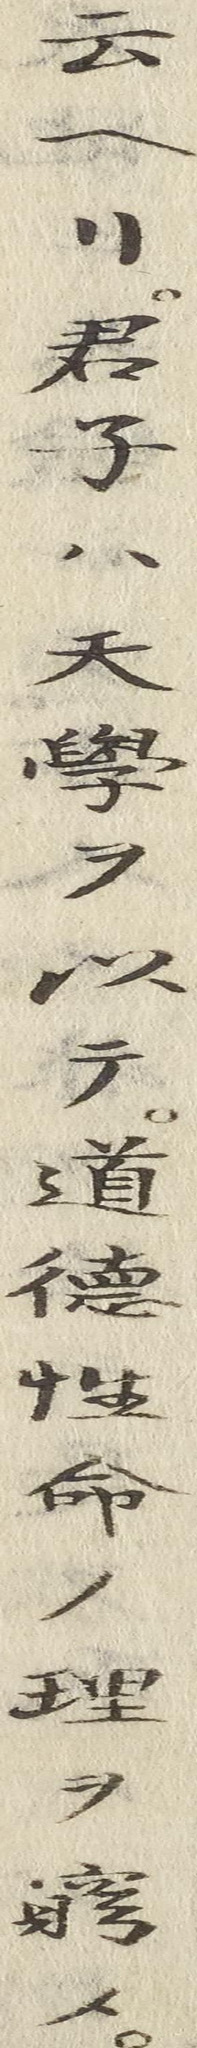云ヘリ。君子ハ天学ヲ以テ。道徳性命ノ理ヲ窮メ。
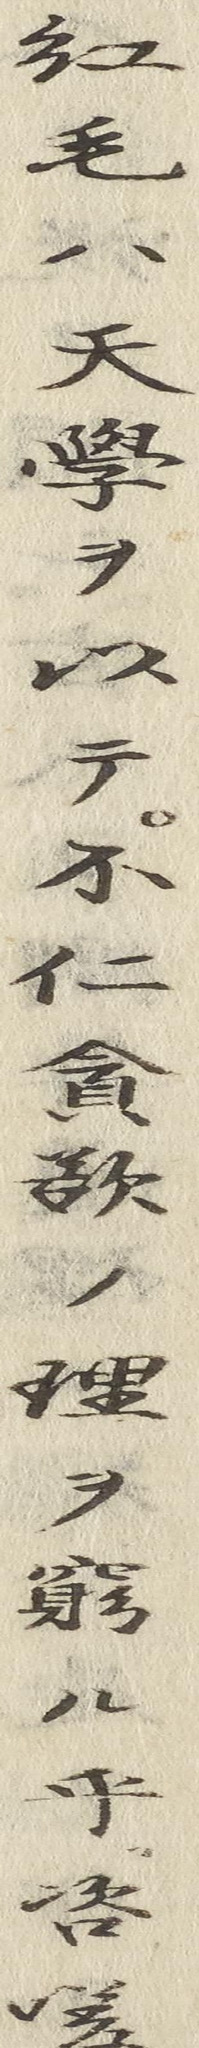紅毛ハ天学ヲ以テ、不仁貪欲ノ理ヲ窮ル乎。咨嗟
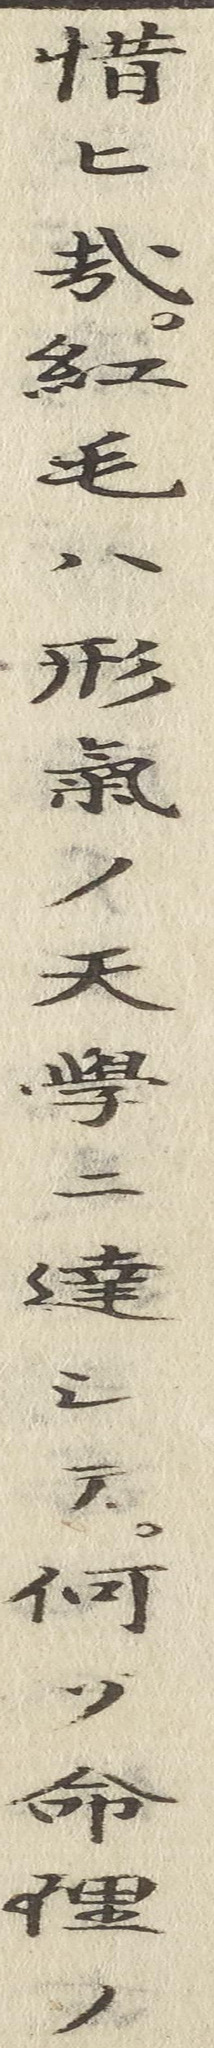惜ヒ哉。紅毛ハ形気ノ天学ニ達シテ。何ソ命理ノ
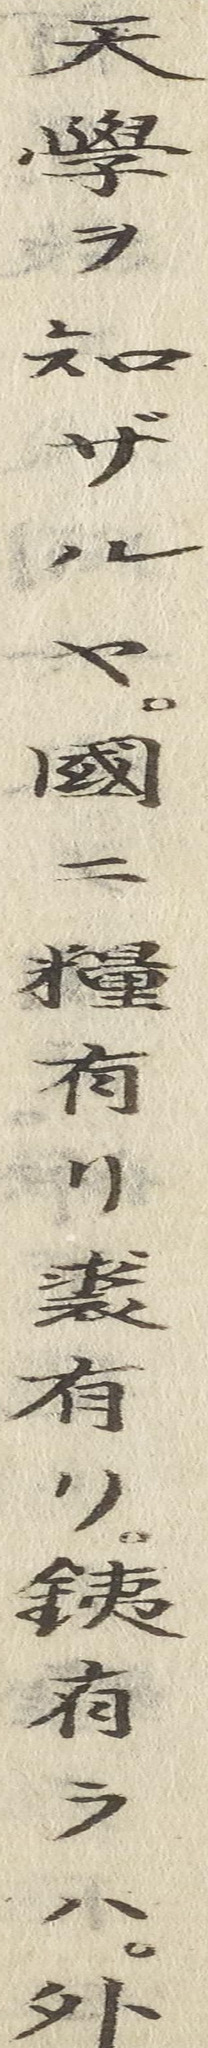天学ヲ知ザルヤ。国ニ糧有リ裘有リ。。銕有ラハ。外
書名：大略天学名目鈔　天經或問附録
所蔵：東京大学地震研究所図書室 Earthquake Research Institute Library, The University of Tokyo, JAPAN
